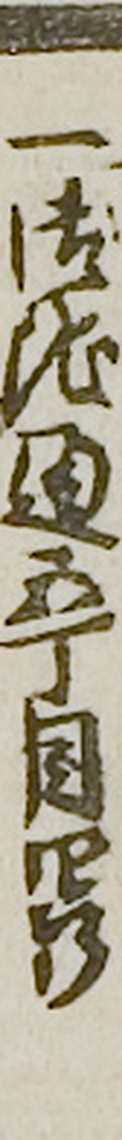一御池通五丁目四軒
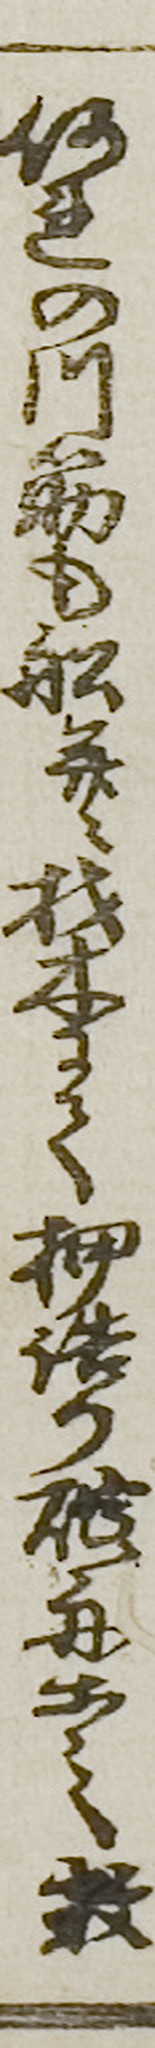何れの川筋も船并に材木にて押詰り破舟等々数
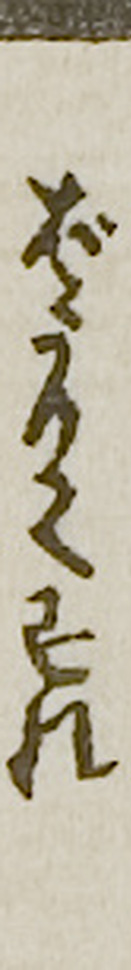ばかりくすれ
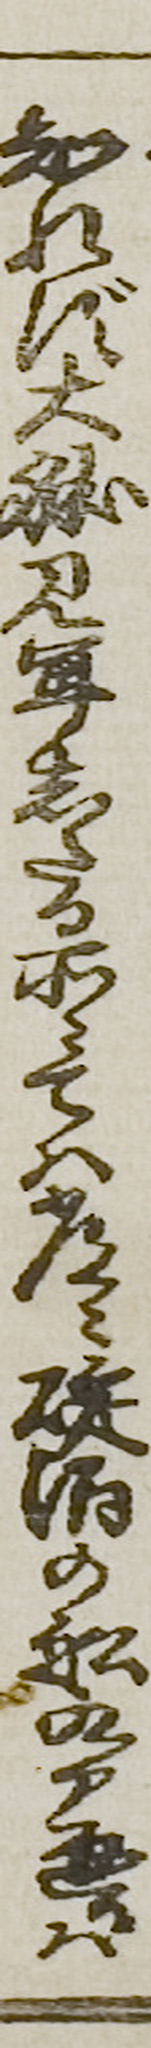知れず大躰見聞したる所にては常々碇泊の船九部通りは
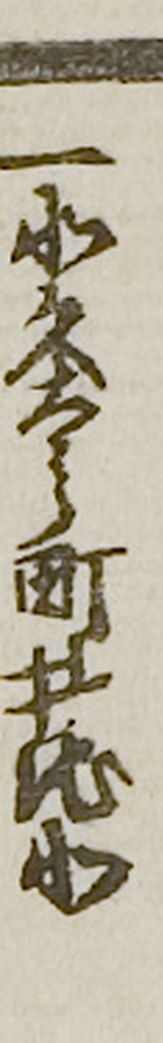一北久太郎町丼池北
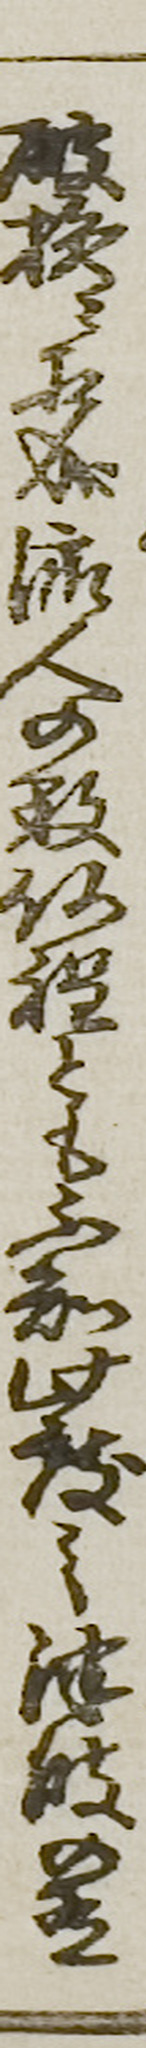破損に相成流人の数何程とも不知此度之津波の有
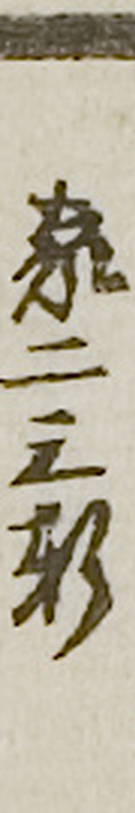家二三軒
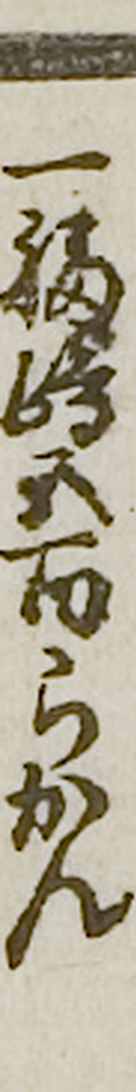一福嶋五百らかん
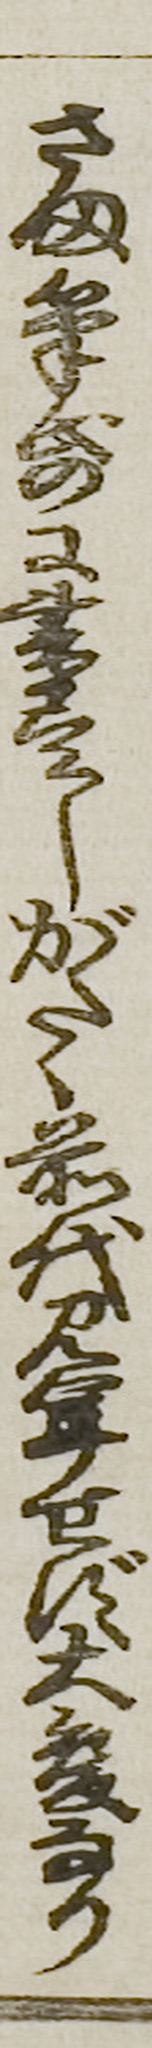さま筆紙に書尽しがたく前代見聞せず大変なり
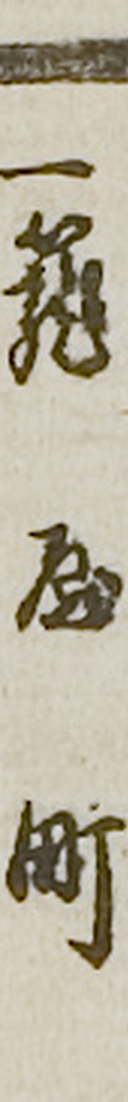一籠屋町
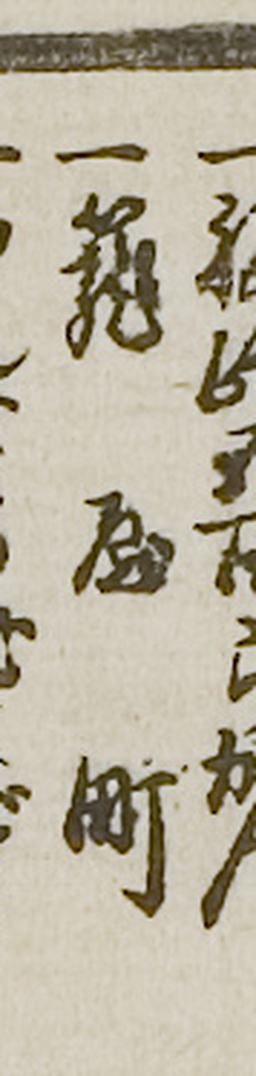一籠屋町
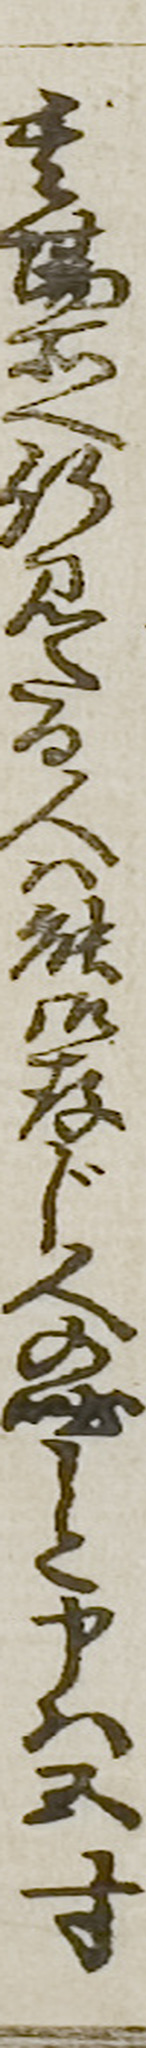其場所へ行見たる人は能御存じ人の咄しと申は五寸
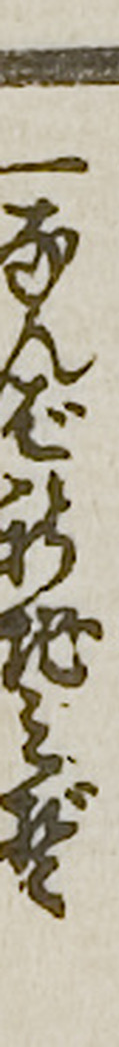一なんば新地みぞ
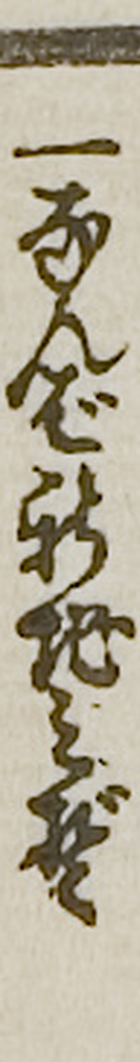一なんば新地みぞ
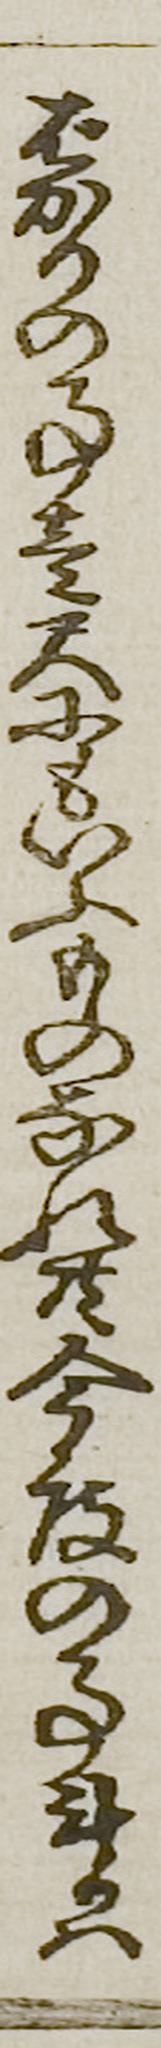ばかりの事壱尺にもいふものなれ共今度の事斗りは
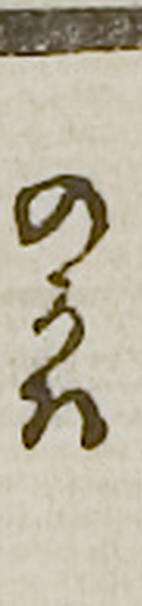のかは
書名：大坂辺東海道本しらべ大地震津波図
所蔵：東京大学総合図書館 General Library in the University of Tokyo, JAPAN
